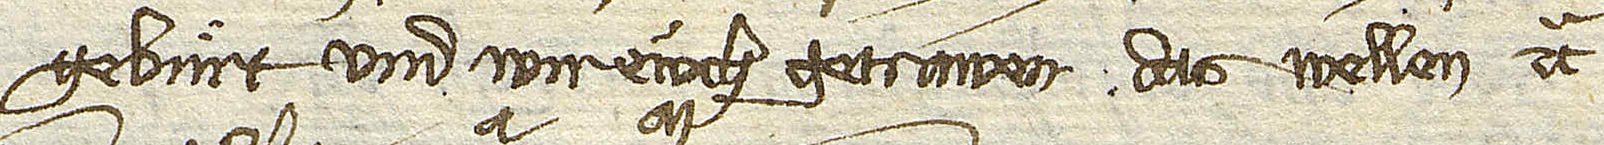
gebürt vnd wir ewch getrawen . das wellen ec*
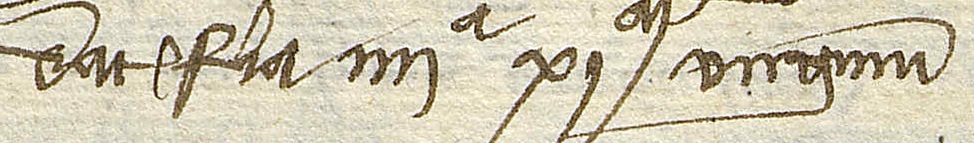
Dat* f*ia iiii* xi* virginu*
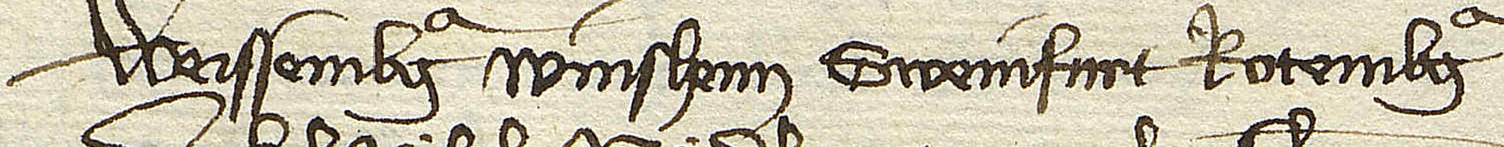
Weiſſemb*g winſheim Sweinfurt Rotemb*g
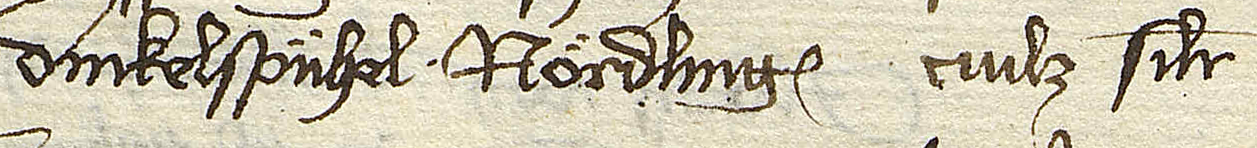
Dinkelſpühel . Nördling* cuil* ſilr*
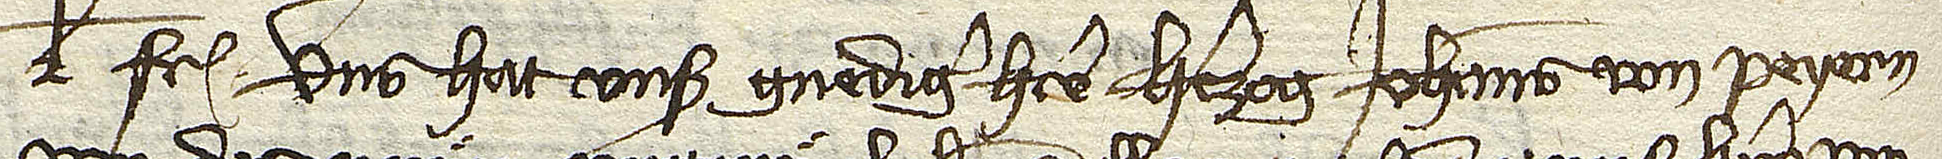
L* fr* . Vns hat vnſ* gnedig* h*re H*cʒog Iohan*s von Peyern
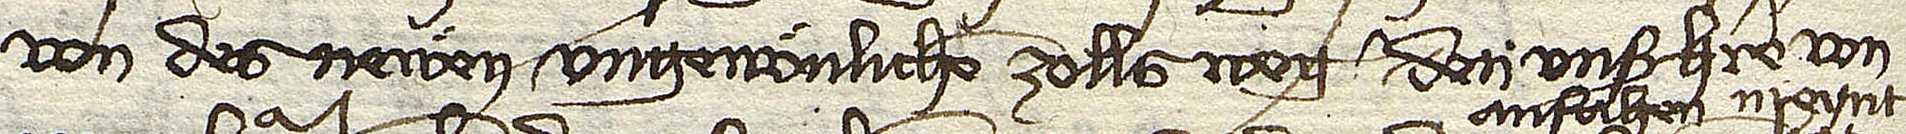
von des newen vngewönliche* ʒolls weg* / Den vnſ* h*re von
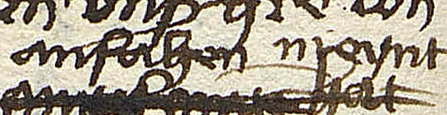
anfahen meynt
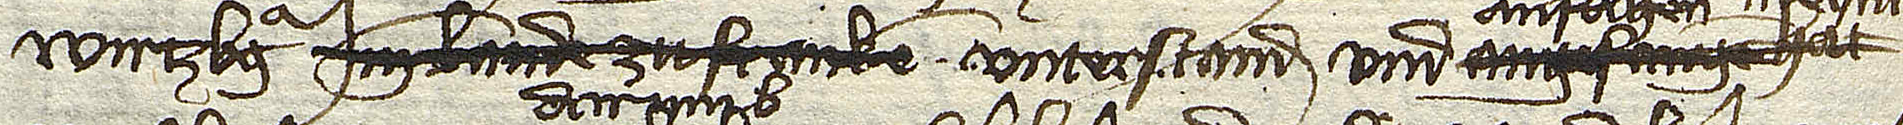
wircʒb*g Im* lande ʒu franke* . vnterſtand* vnd angefange* hat
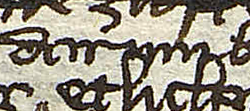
darumb
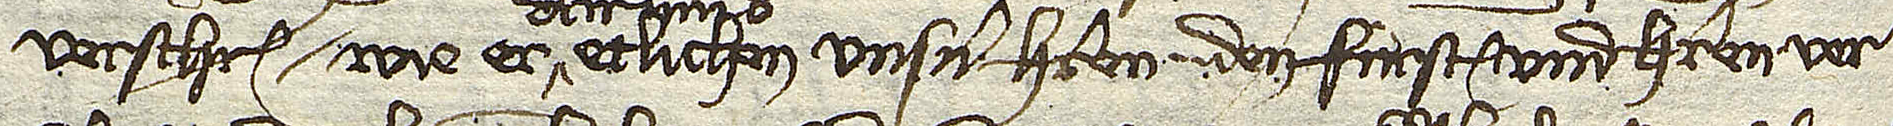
verſchr* / wie er etlichen vnſn* h*ren ~ den fürſt* vnd h*ren ver
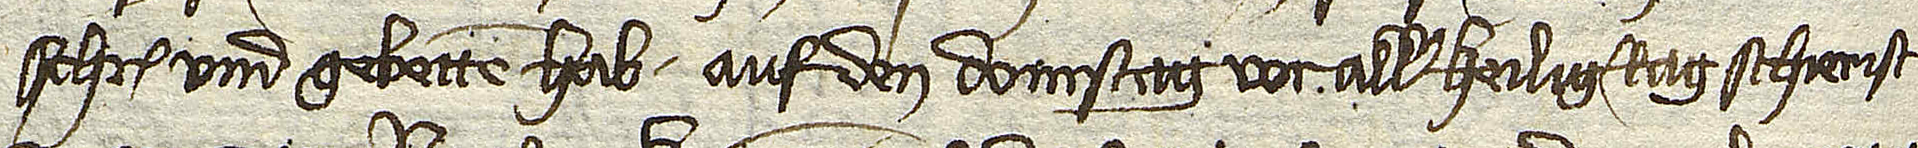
ſchr* vnd gebette* hab / auf den donrſtag vor all* heilig*tag ſchieriſt
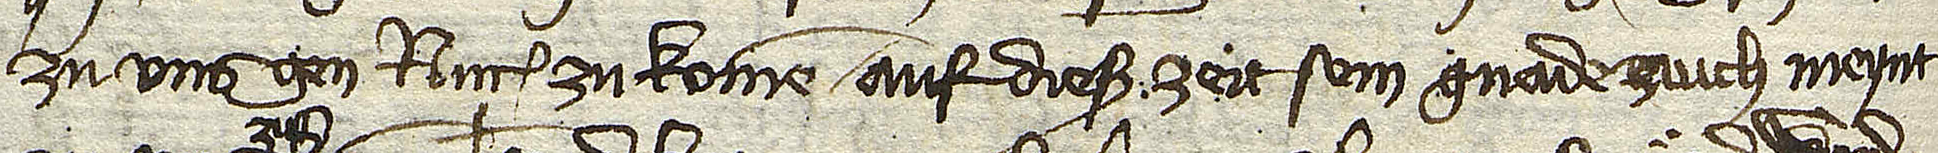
ʒu vns gen Nur* ʒu kome* / auf dieſ* ʒeit ſein gnade auch meynt
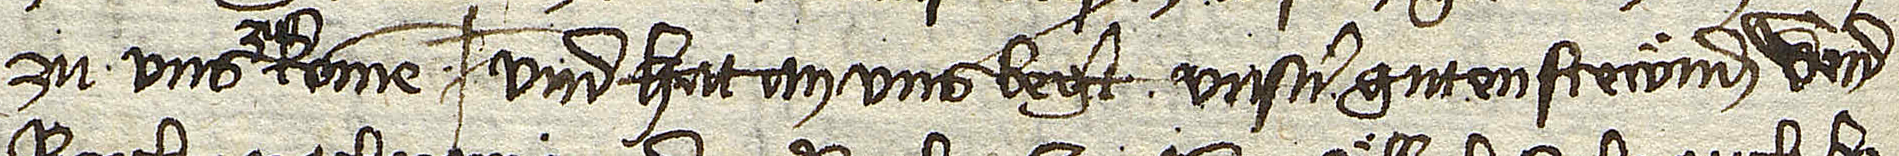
ʒu vns kome* . vnd hat an vns beg*t . vnſ*n guten frewnd* Vnd
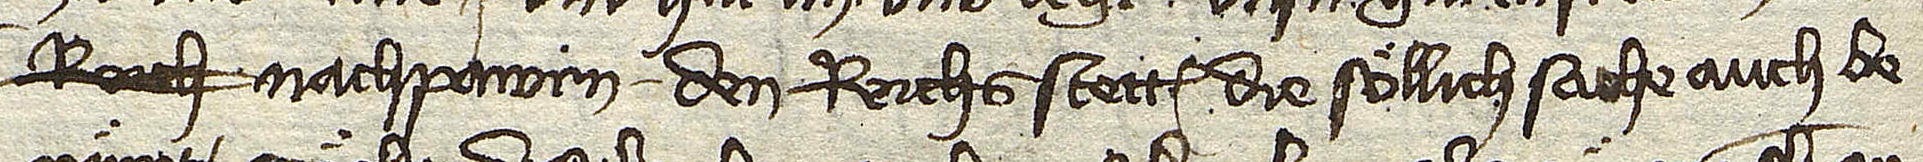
Reich nachpawrn . den Reichs ſtett* die ſöllich ſache auch be
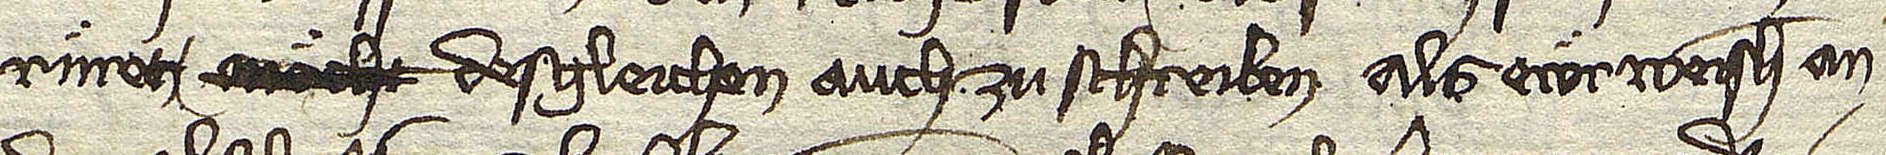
rüret möcht deſgleichen auch ʒu ſchreiben als ewr weiſh* an
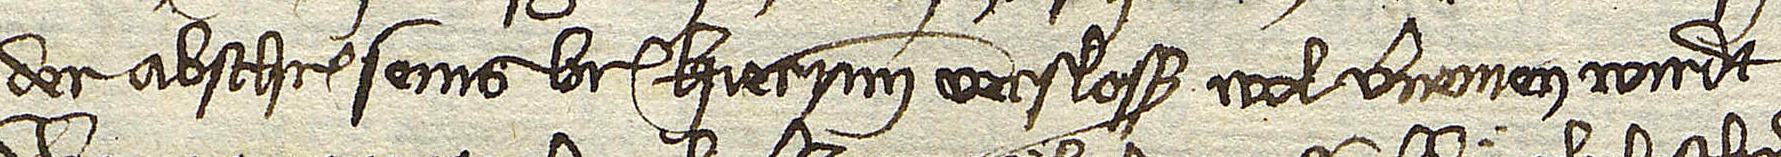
der abſchr* ſeins br* hierynn* verſloſſ* wol v*nemen wirdt
